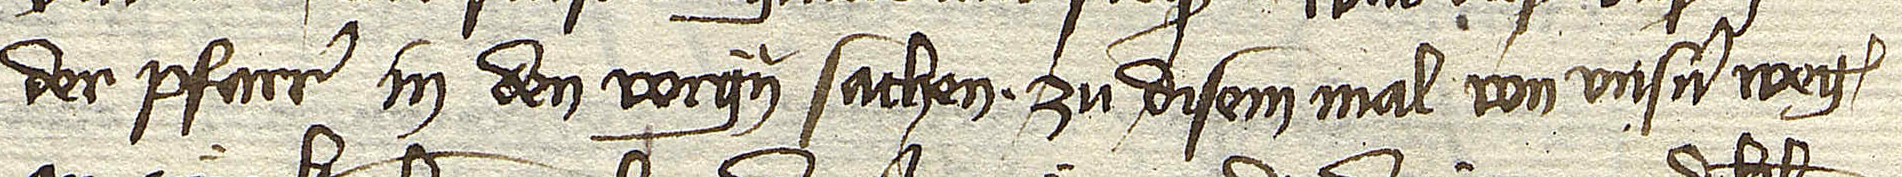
der pfarr* in den vorgn* ſachen . ʒu diſem mal von vnſn* weg*
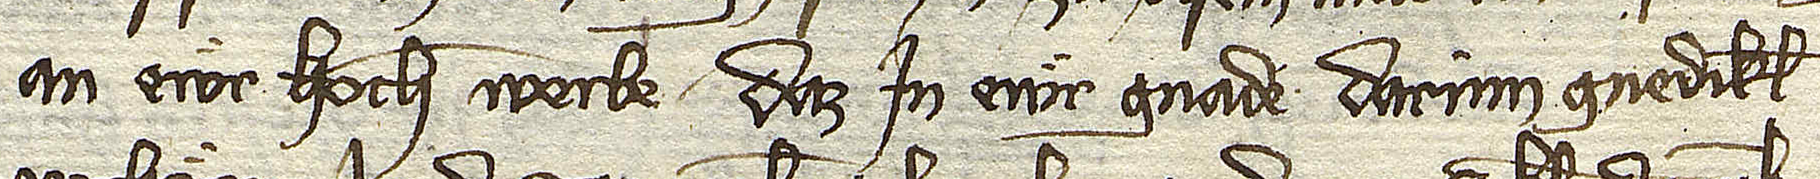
an ewr Hoch* werbe / Daʒ In ewr gnade darinn gnedikl*
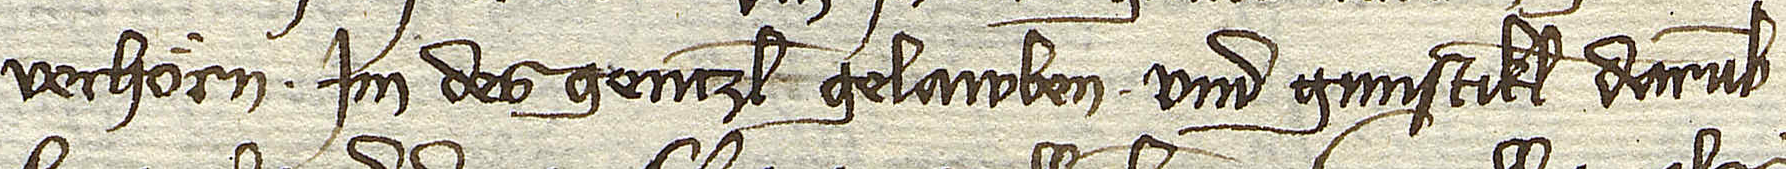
verhörn . Im des gencʒl* gelawben . vnd gunſtikl* darub*
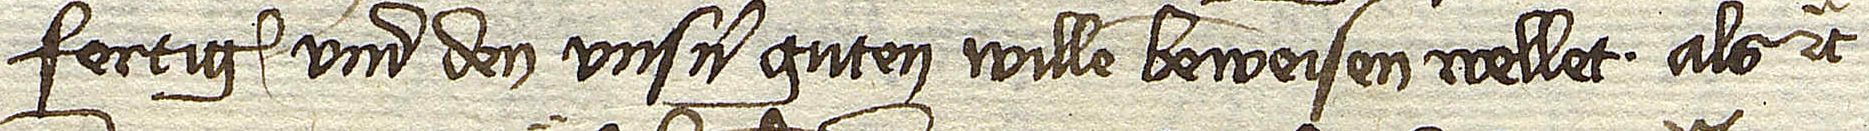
fertig* vnd den vnſn* guten wille* beweiſen wellet . als ec*
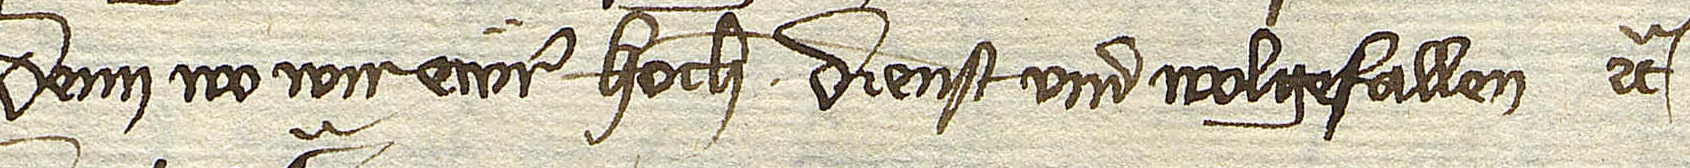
Denn wo wir ewr* Hoch* . Dienſt vnd wolgefallen ec*
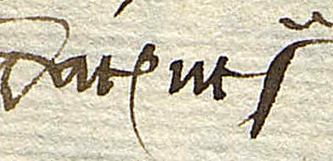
Dat* ut ſ*
